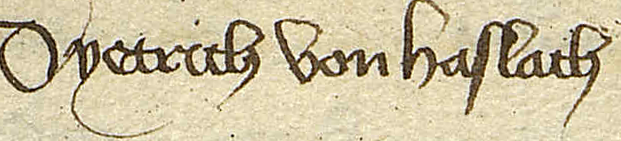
Dyetrich von haſlach
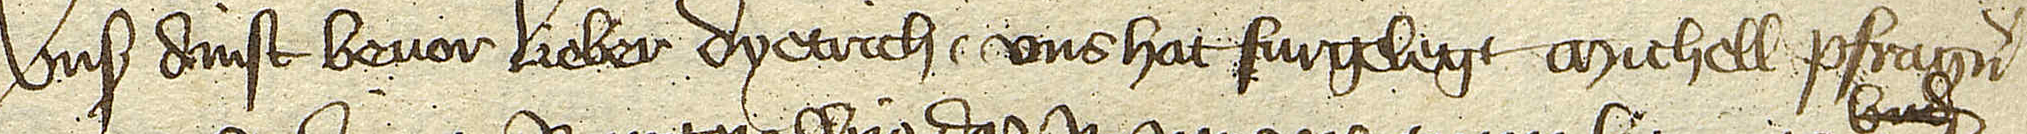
Vnſ* dinſt beuor Lieber dyetrich / vns hat furgelegt Michell Pfragn*
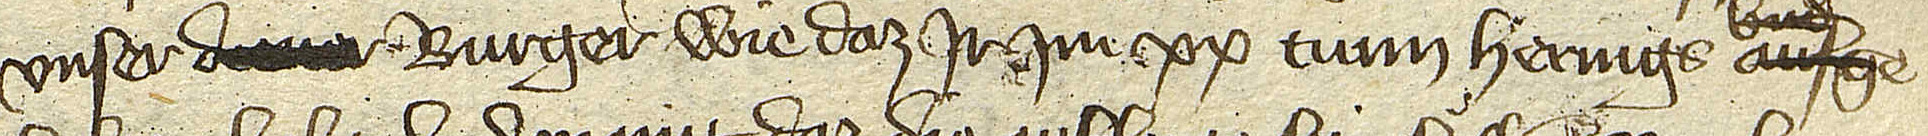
vnſer diener Burger / wie daʒ Ir Im xx tunn herings aufge
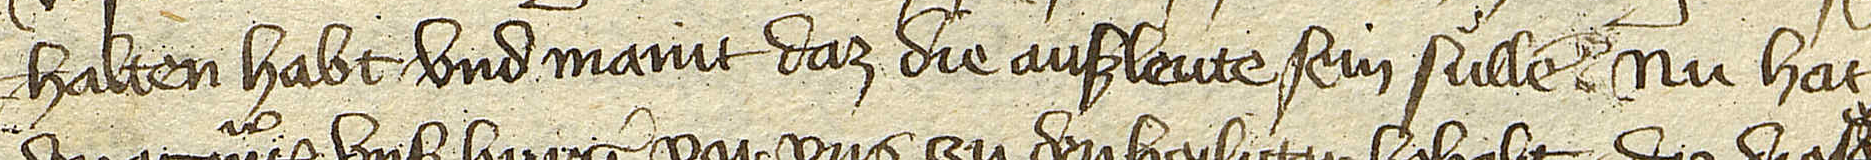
halten habt / vnd maint daʒ die auſʒleute ſein ſülle* / Nu hat
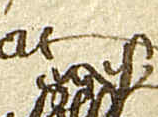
egeſ*
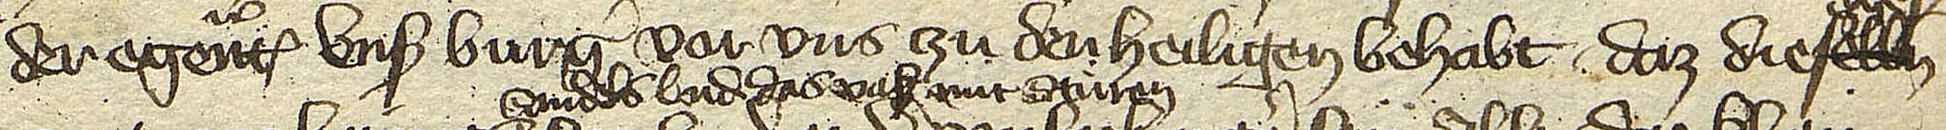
der egent* vnſ* burg* vor vns cʒu den heiligen behabt / daʒ dieſelbn*
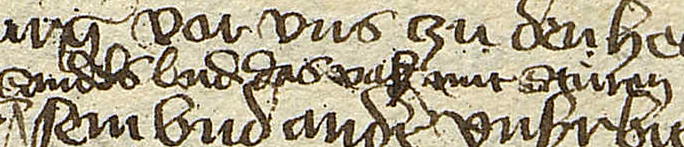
Sandels vnd das vaſʒ mit Stüren
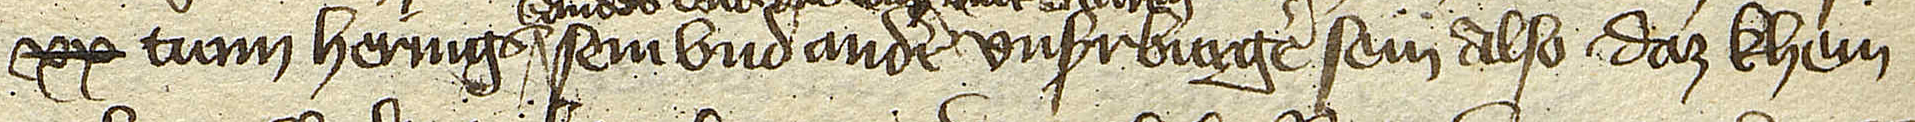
xx tunn herings ſein vnd ande* vnſ*r burge* ſein Alſo / daʒ khein
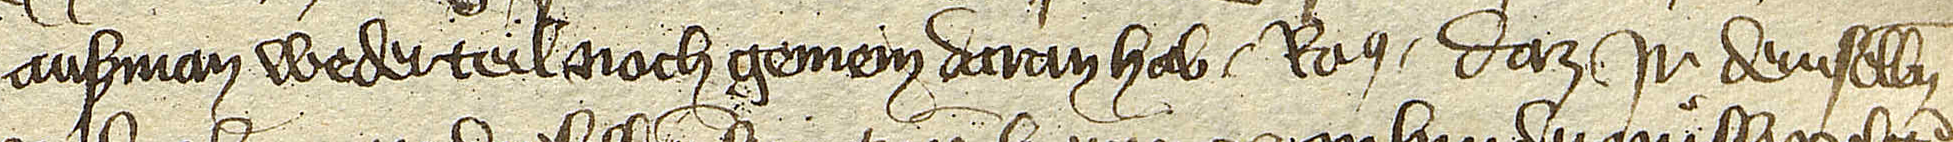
auſʒman wederteil noch gemein daran hab / Ro* / daʒ Ir demſelbn*
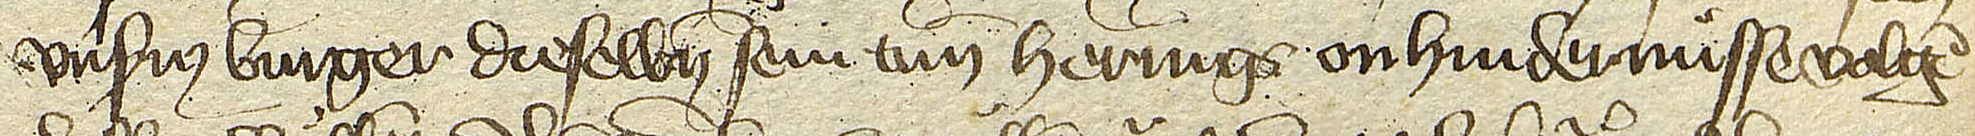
vnſ*m burger dieſelbn* ſein tun* herings onhindernüſſe volge*
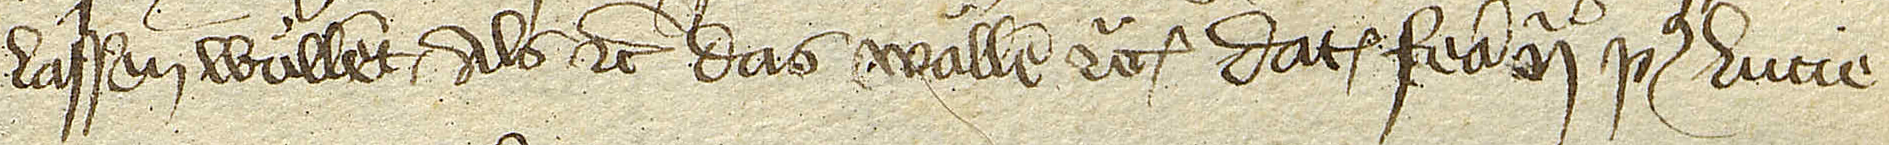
laſſen wöllet / Als ec* das wölle* ec* dat* fea* ii* p* Lucie
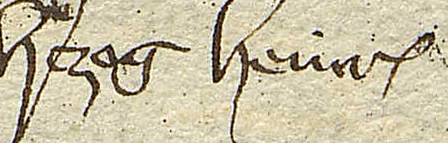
h*cʒog heinr*
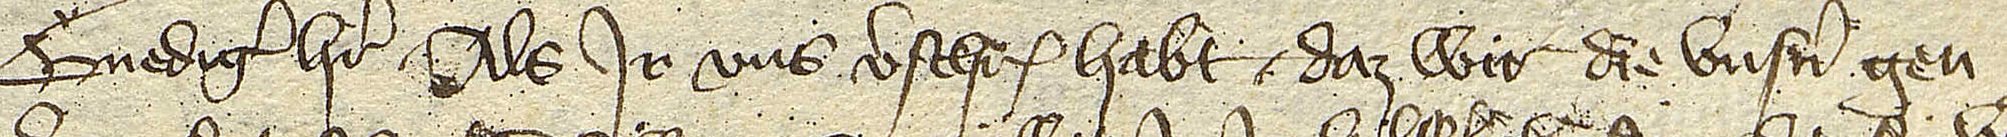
Gnedig* hr* / Als Ir vns v*ſchr* habt / daʒ wir die vnſn* gen
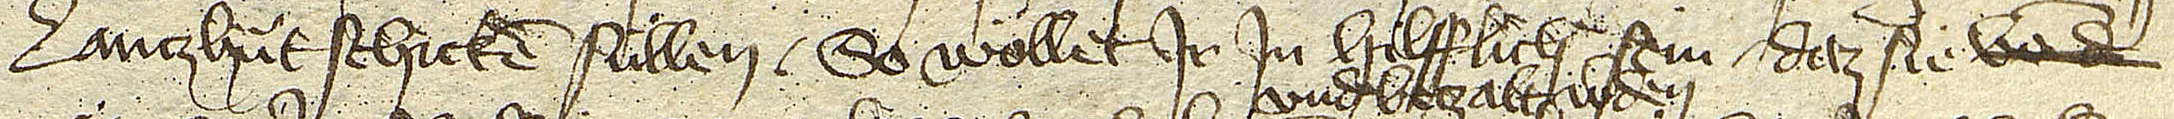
Lancʒhüt ſchicke* ſüllen / So wöllet Ir In hilfflich ſein / daʒ ſie vo* d*
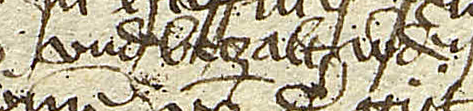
vnd becʒalt w*den
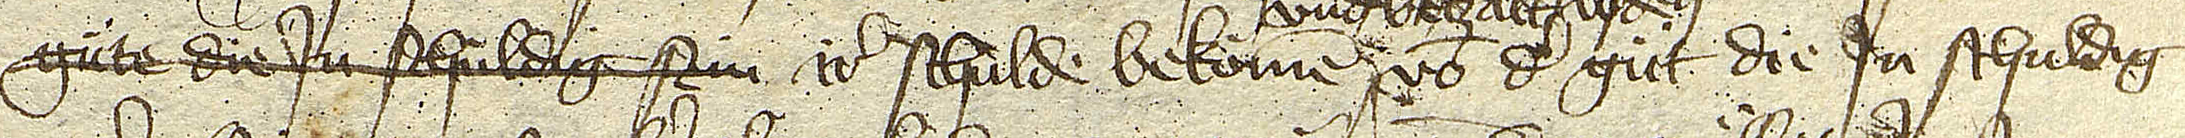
güte die In ſchuldig ſein ir* ſchuld beköme* vo* d* güt die In ſchuldig
